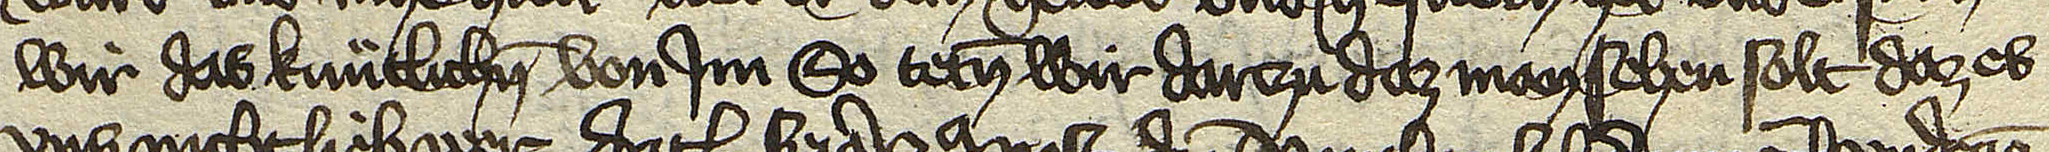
wir das küntlichn* von Im So tetn* wir darcʒu daʒ man ſehen ſolt daʒ es
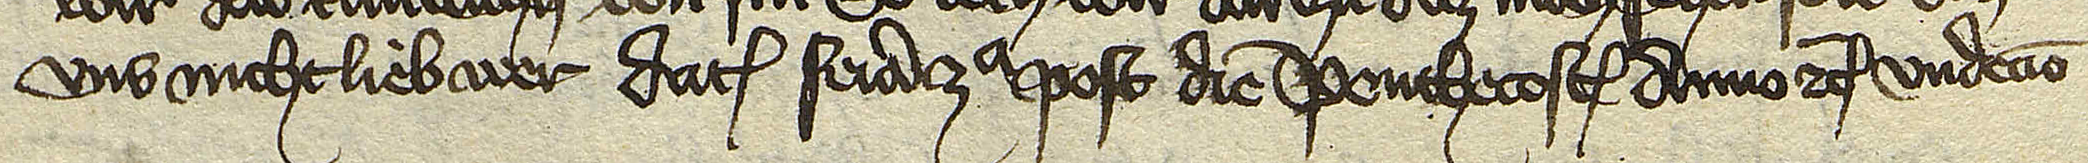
vns nicht lieb wer dat* feia* ʒ* poſt die Penthecoſt* Anno ec* vndecio*
